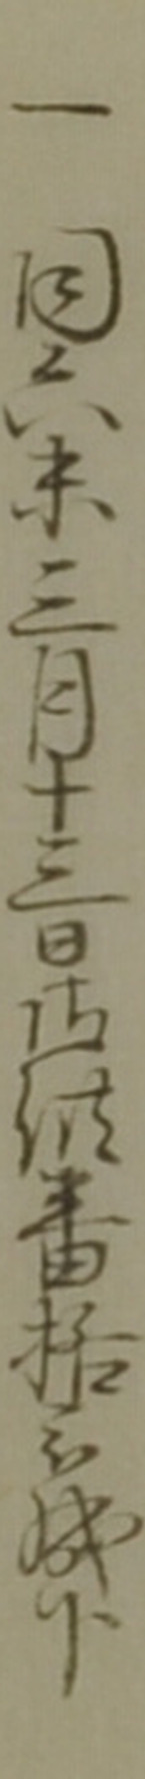一同六未三月十三日御供番格被成下
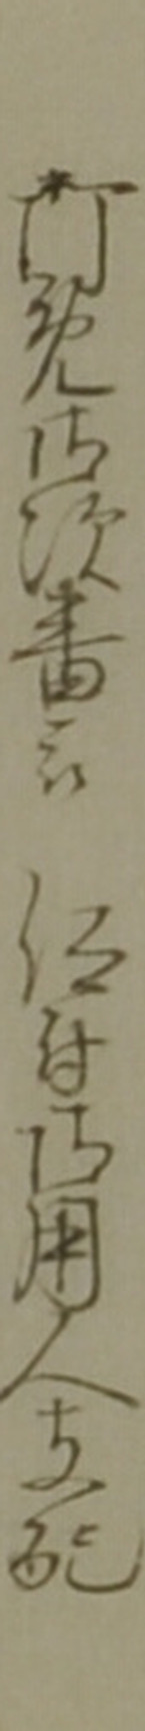御免御次番被仰付御用人支配

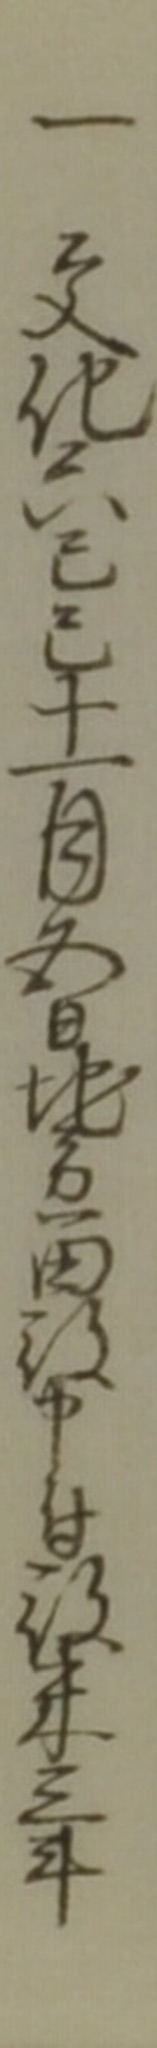一文化六巳巳十一月五日地方◻︎役申付役未三斗
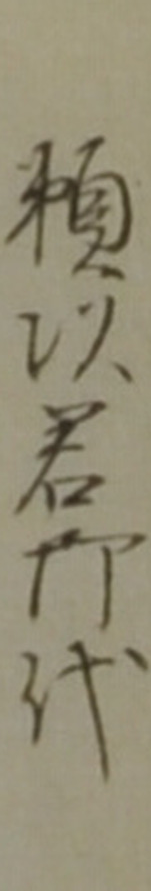頼以君御代
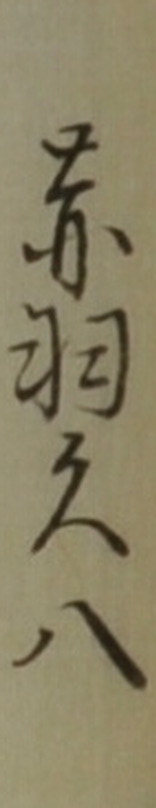赤羽久八
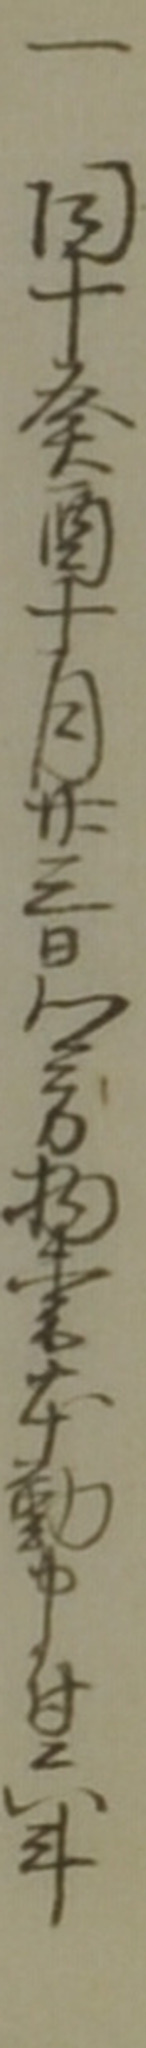一同十癸酉十月廿三日郷方物書本勤申付六斗
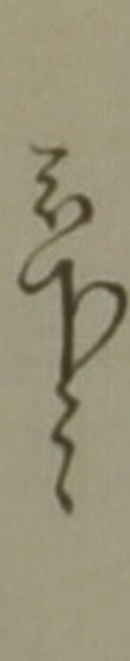被下之
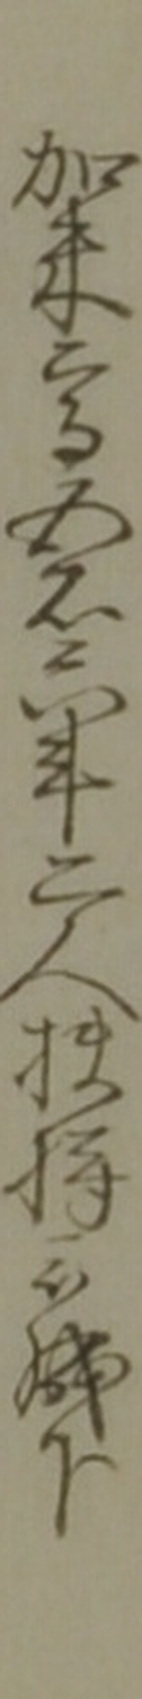加未高五石六斗二人扶持被成下
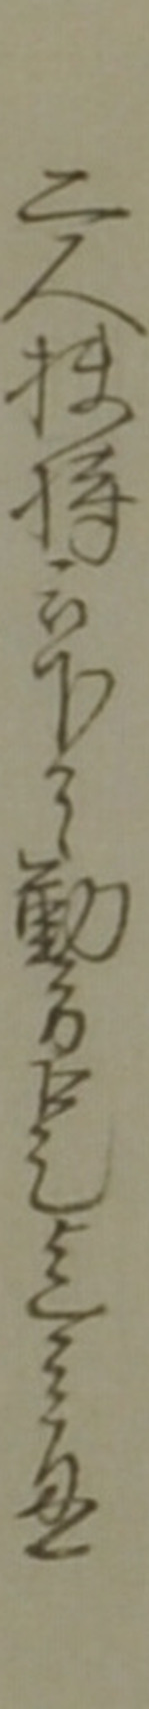二人扶持被下之勤方是迄之通
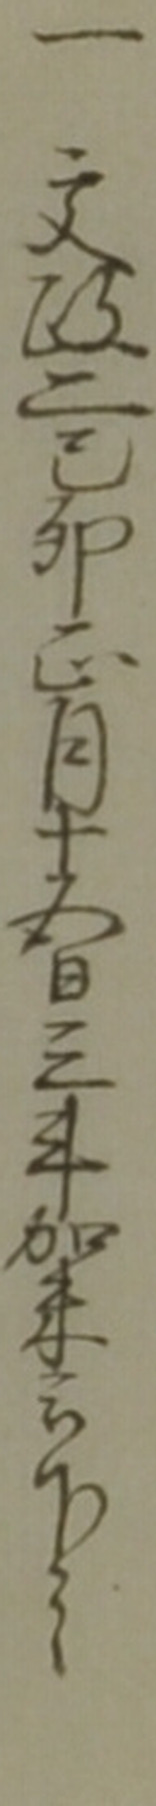一文政二巳卯正月十五日三斗加未被下之
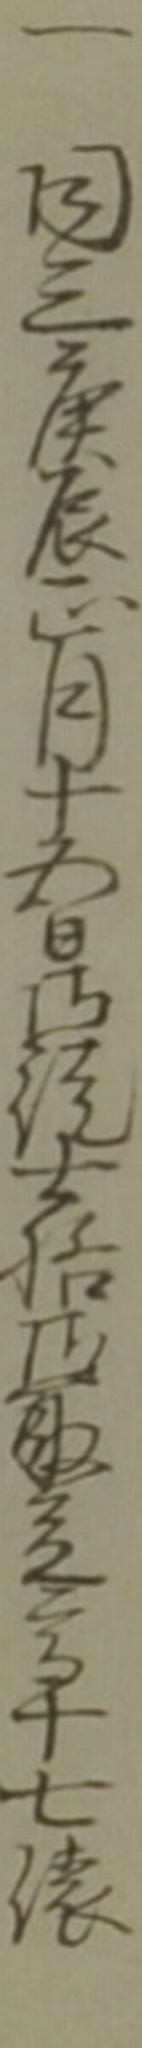一同三庚辰正月十五日御徒士格御取立高十七俵
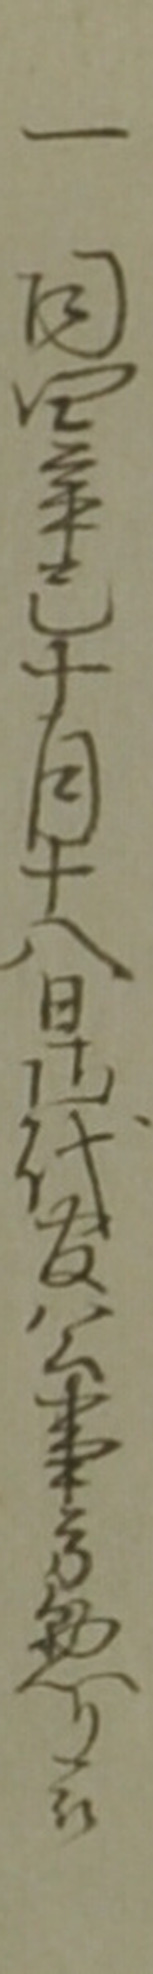一同四辛巳十月十八日御代官公事方◻︎り被
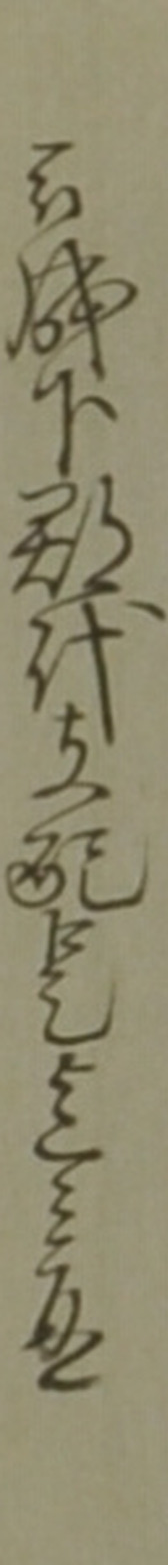被成下郡代支配是迄之通
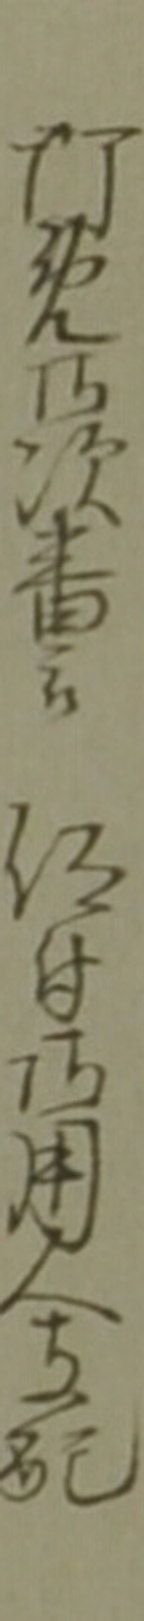御免御次番被仰付御用人支配

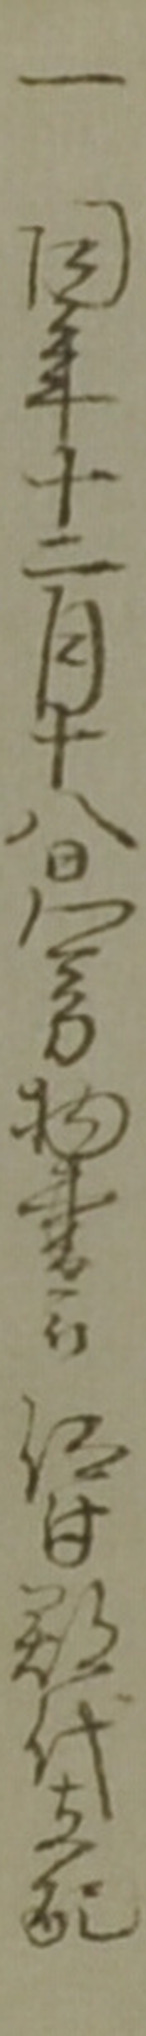一同年十二月十八日郷方物書被仰付郡代支配
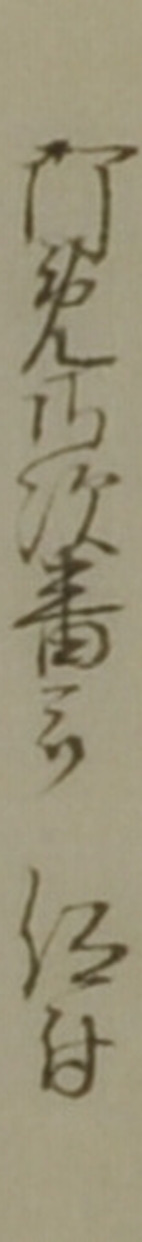御免御次番被仰付
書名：無足諸士勤仕録（五）
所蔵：伊那市立高遠町図書館・合同会社AMANE
